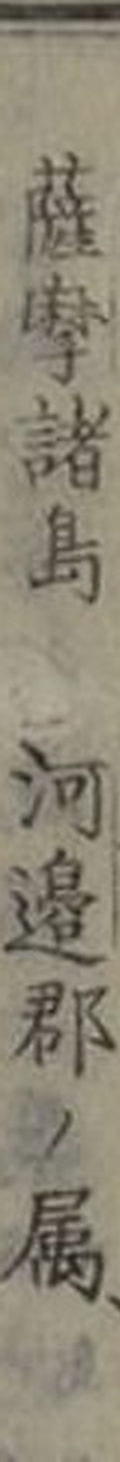薩摩諸島河辺郡ノ属、
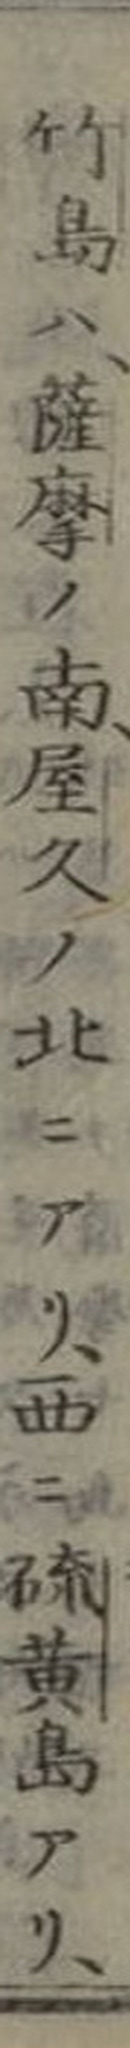竹島ハ、薩摩ノ南、屋久ノ北ニアリ、西ニ硫黄島アリ、
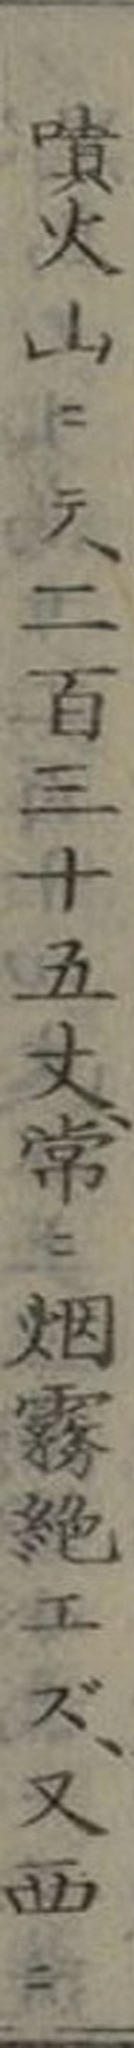噴火山ニテ、二百三十五丈、常ニ煙霧絶エズ、又西ニ

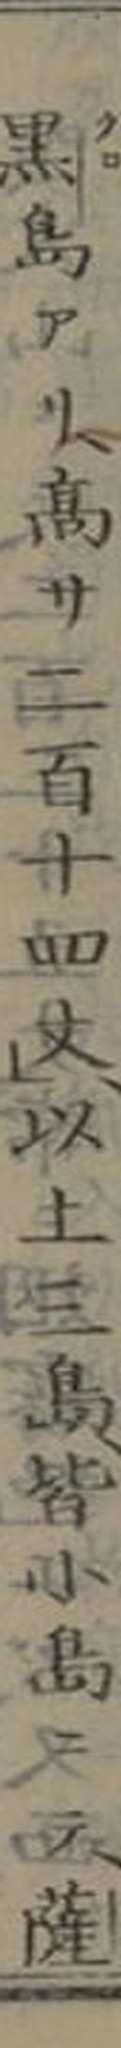黒島アリ、高サ二百十四丈、」以上三島、皆小島ニテ、薩
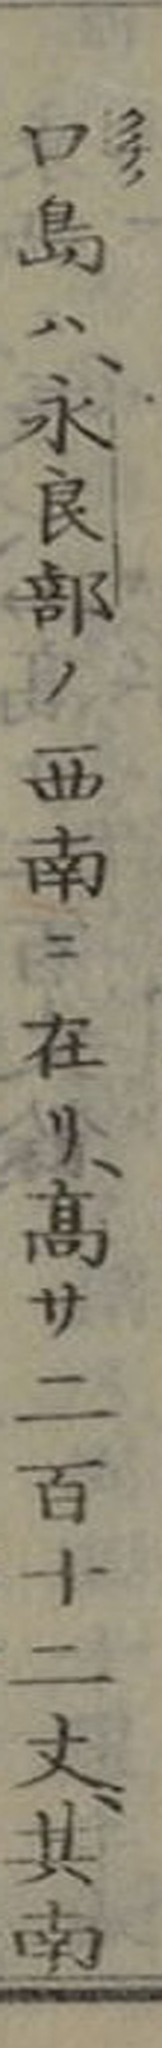口島ハ、永良部ノ西南ニ在リ、高サ二百十二丈、其南
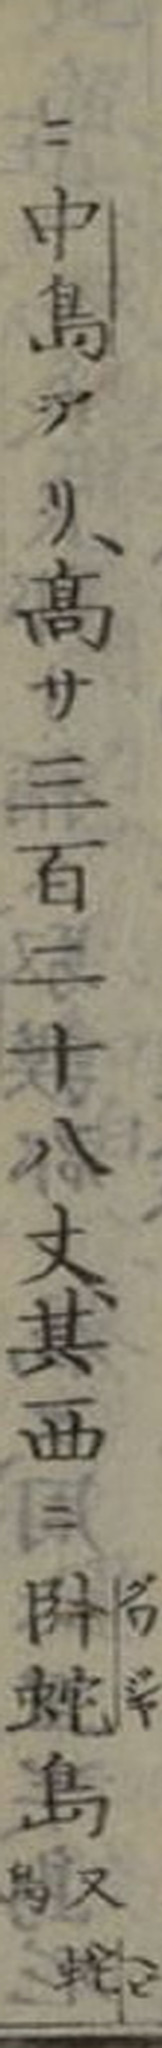ニ中島アリ、高サ三百二十八丈、其西ニ卧蛇島又蛇島
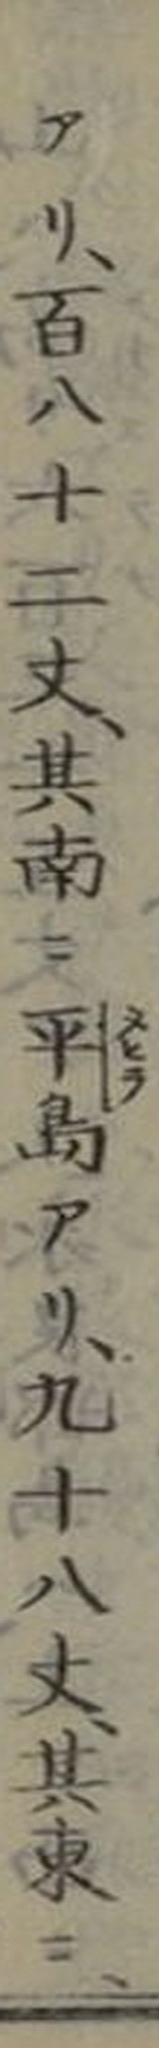アリ、百八十二丈、其南ニ平島アリ、九十八丈、其東ニ、
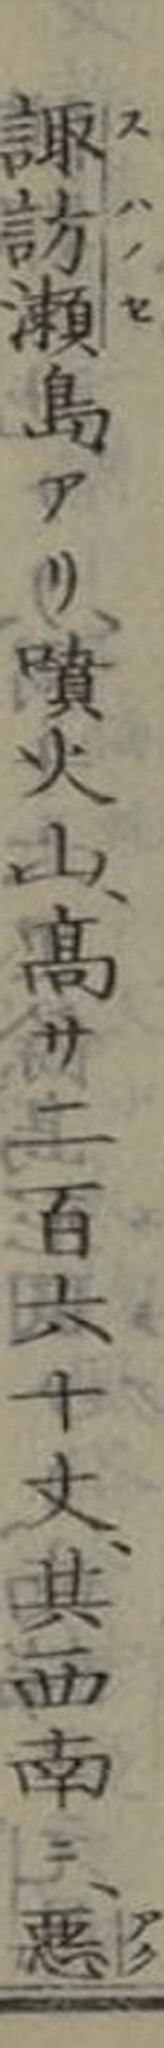諏訪瀬島アリ、噴火山、高サ二百六十丈、其西南ニ、悪
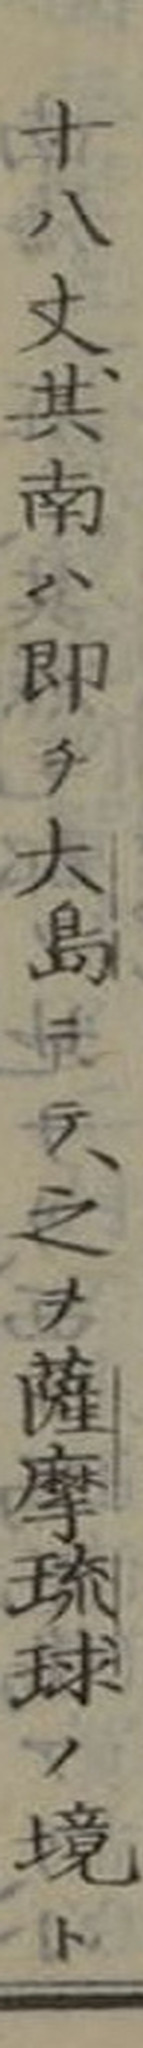十八丈、其南ハ即チ大島ニテ、之ヲ薩摩琉球ノ境ト
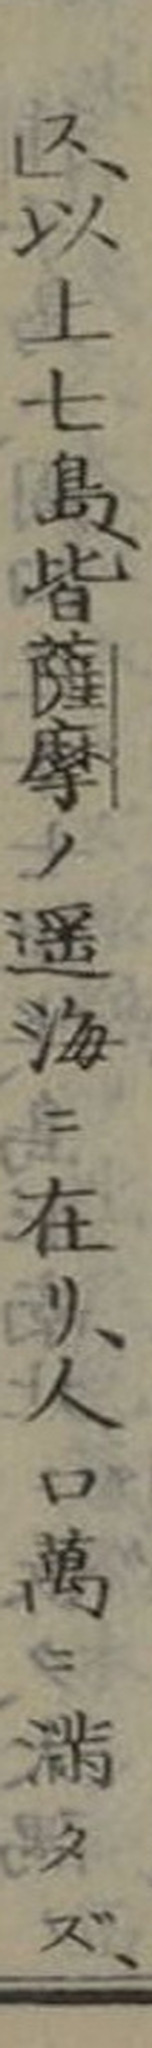ス、」以上七島、皆薩摩ノ遥海ニ在リ、人口万ニ満タズ、
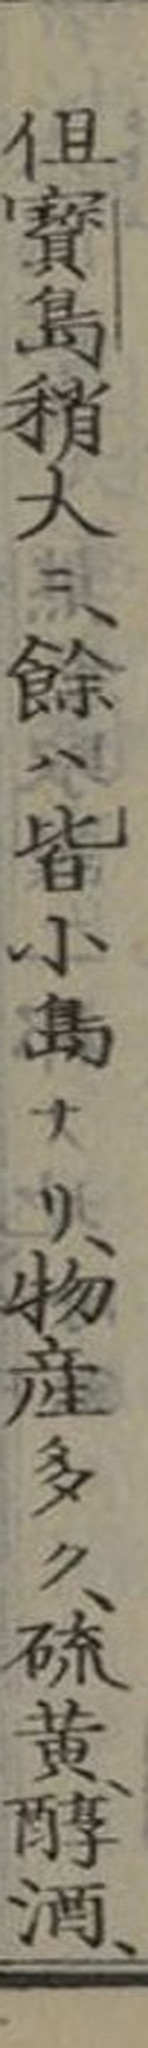但宝島稍大ニ、余ハ皆小島ナリ、物産多ク、硫黄、醇酒、
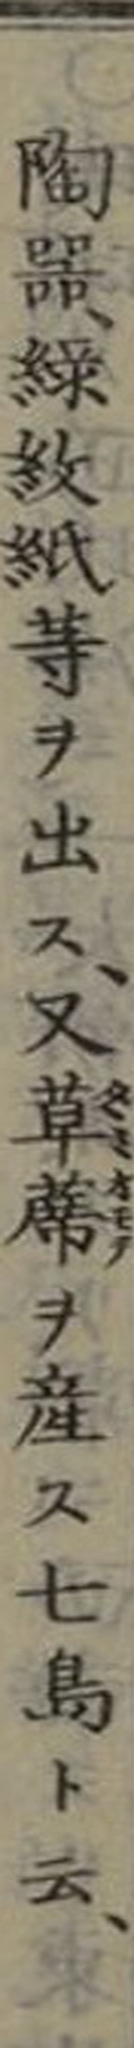陶器、緑紋紙等ヲ出ス、又草蓆ヲ産ス七島ト云、
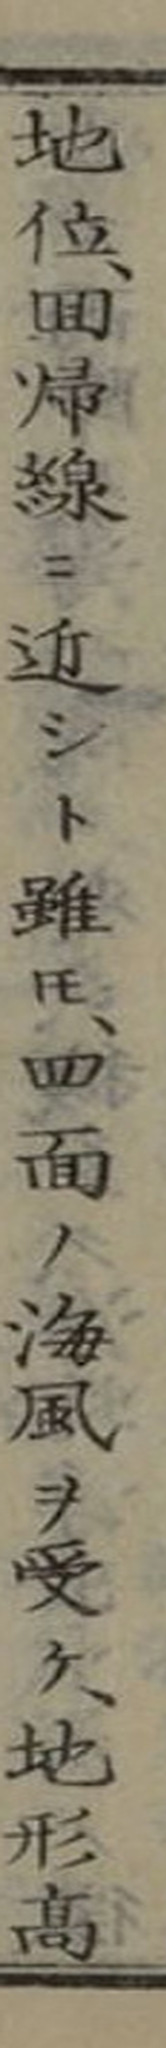地位、回帰線ニ近シト雖トモ、四面ノ海風ヲ受ケ、地形高
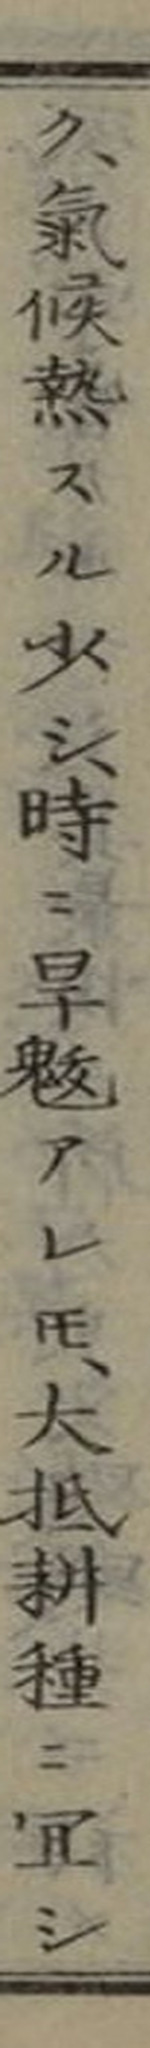ク、気候熱スル少シ、時ニ旱魃アレトモ、大抵耕種ニ宜シ
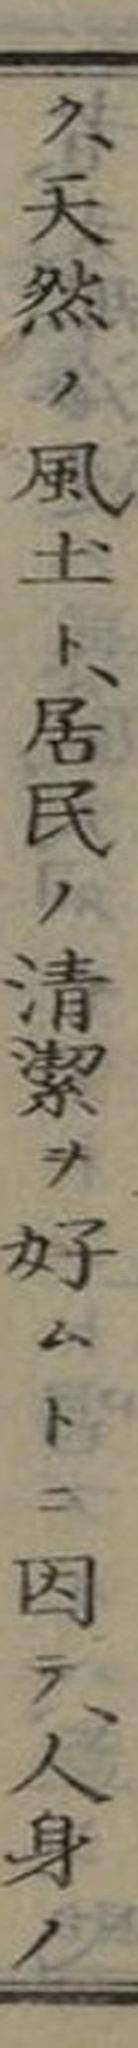ク、天然ノ風土ト、居民ノ清潔ヲ好ムトニ因テ、人身ノ
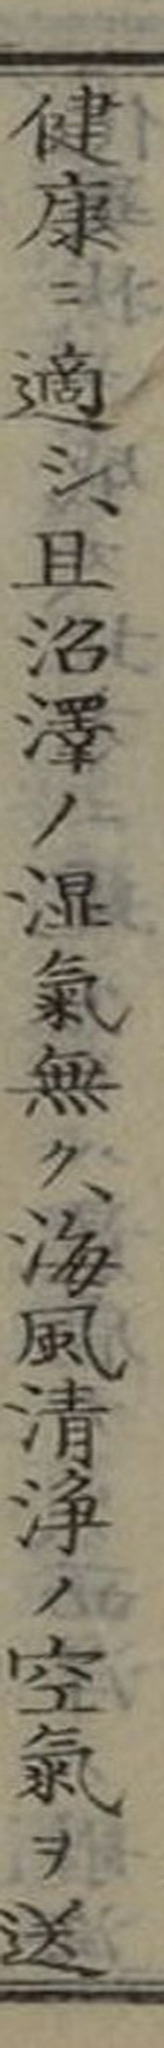健康ニ適シ、且沼沢ノ湿気無ク、海風清浄ノ空気ヲ送
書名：琉球新誌 図附 上
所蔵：University of the Ryukyus Library
